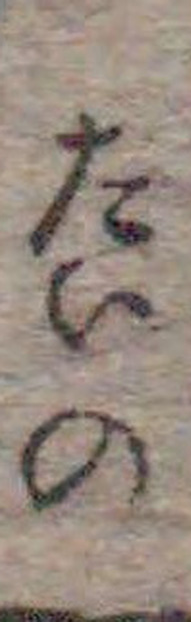たいの

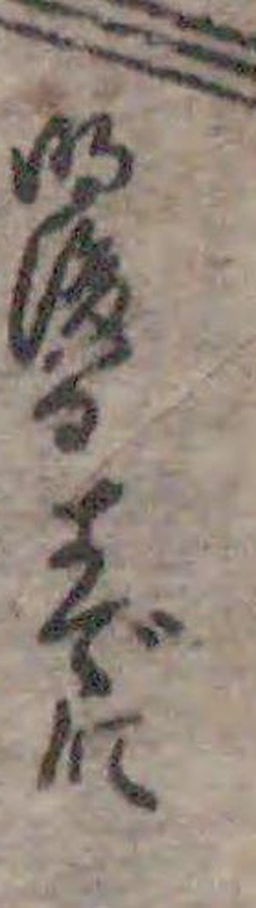明後日までに
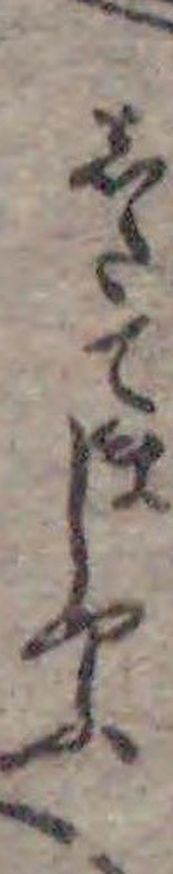したてましやふ
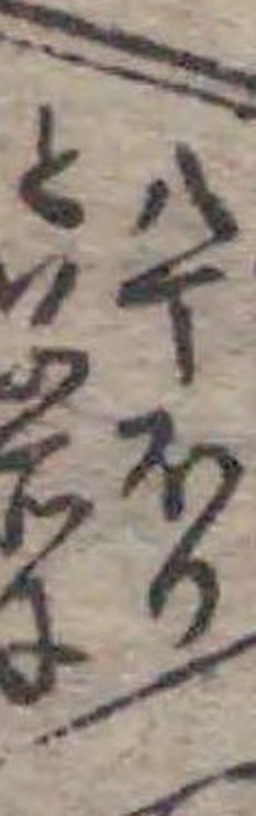といふ所に
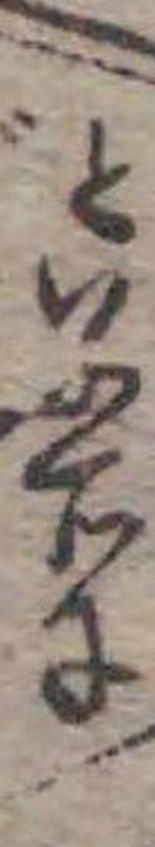といふ所に
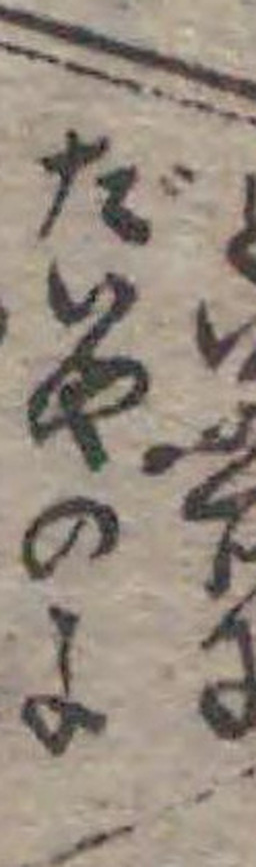だいやのよ
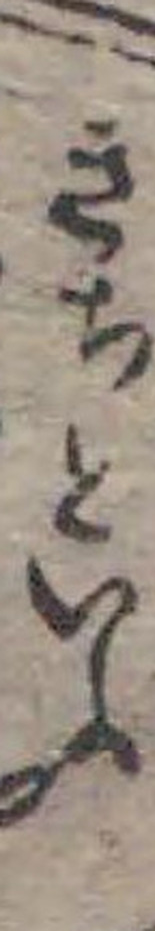きちといふ
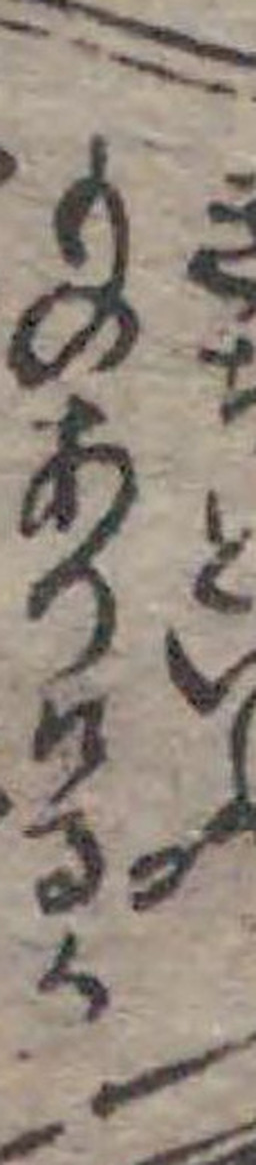ものありけるか
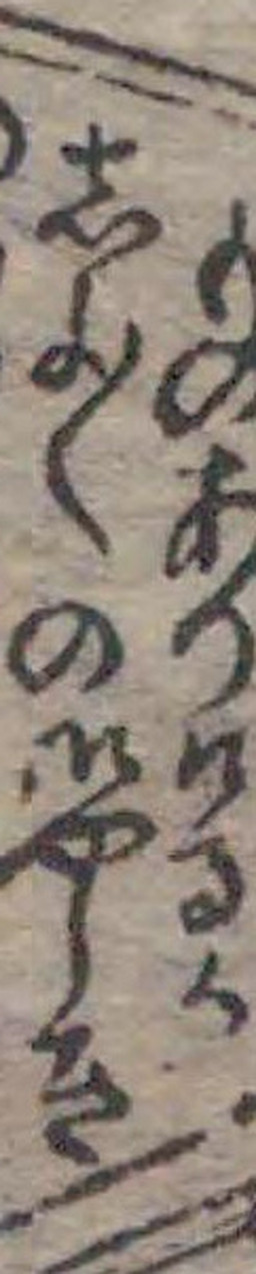しよ〳〵の御やしき
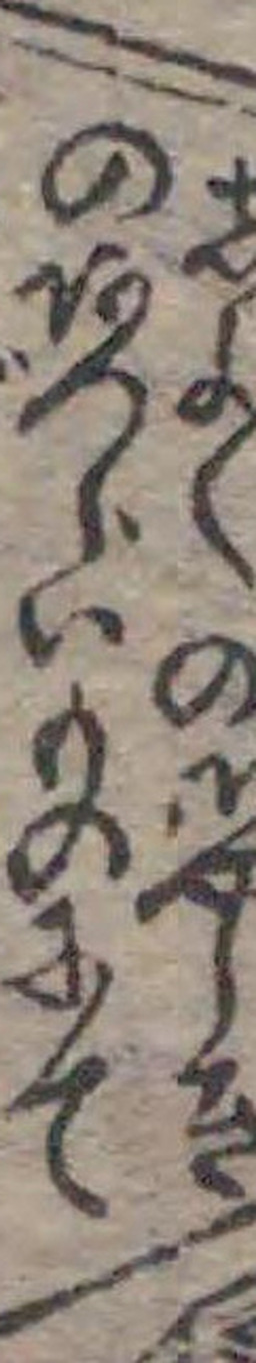のあつらいものにて
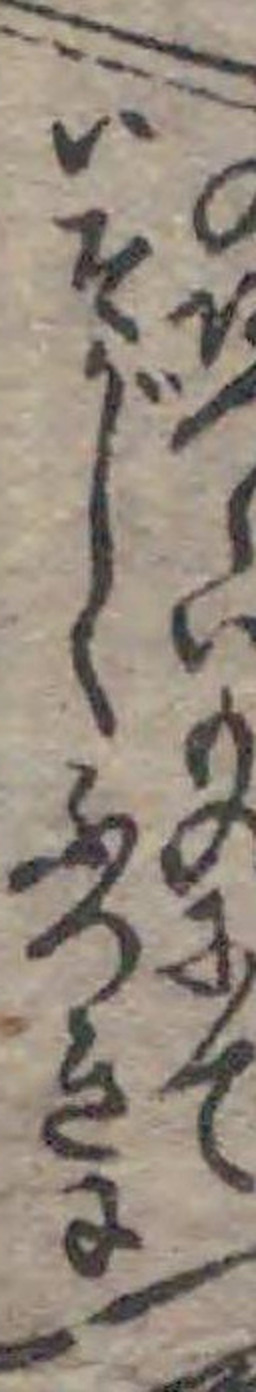いそがしくふつきに
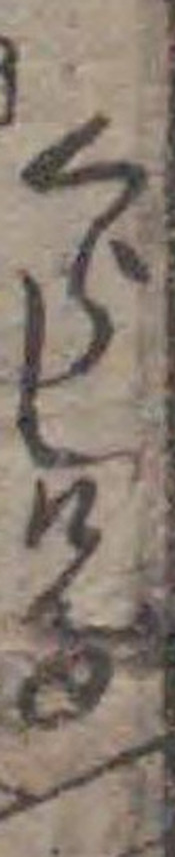くらしける
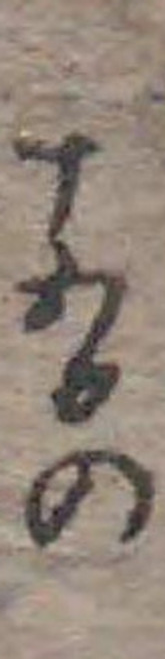十五日の
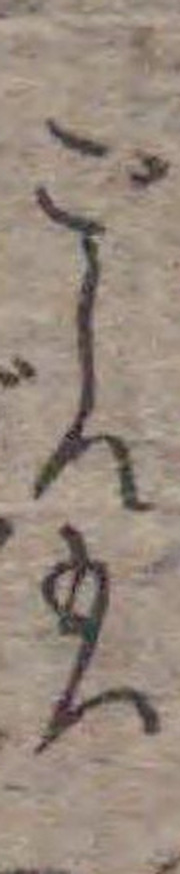ごしんもん
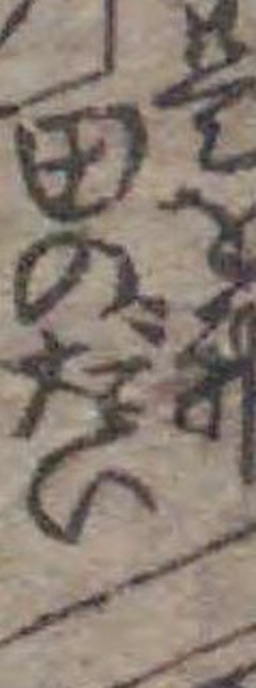田のだい
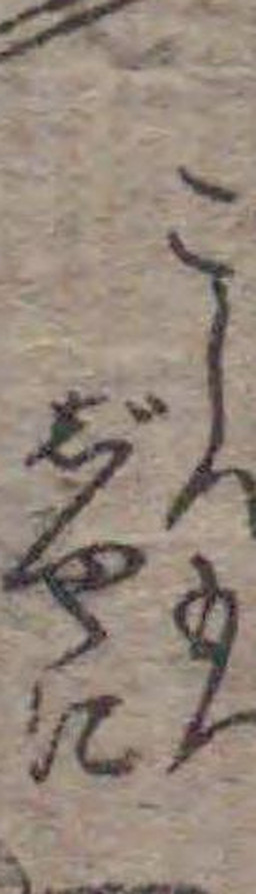じやに
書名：神田与吉一代記 : 3巻
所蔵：国立国会図書館 National Diet Library, JAPAN
